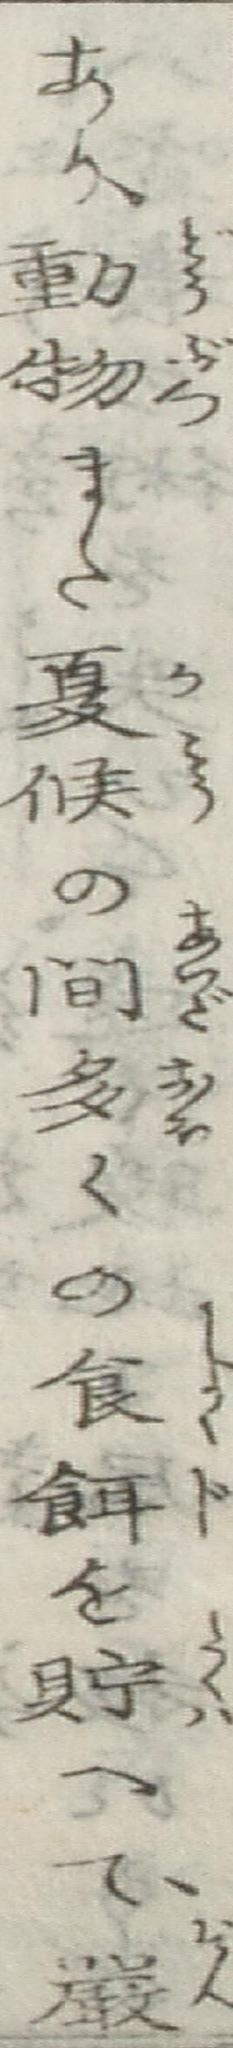あり、動物また夏候の間多くの食餌を貯へて、厳
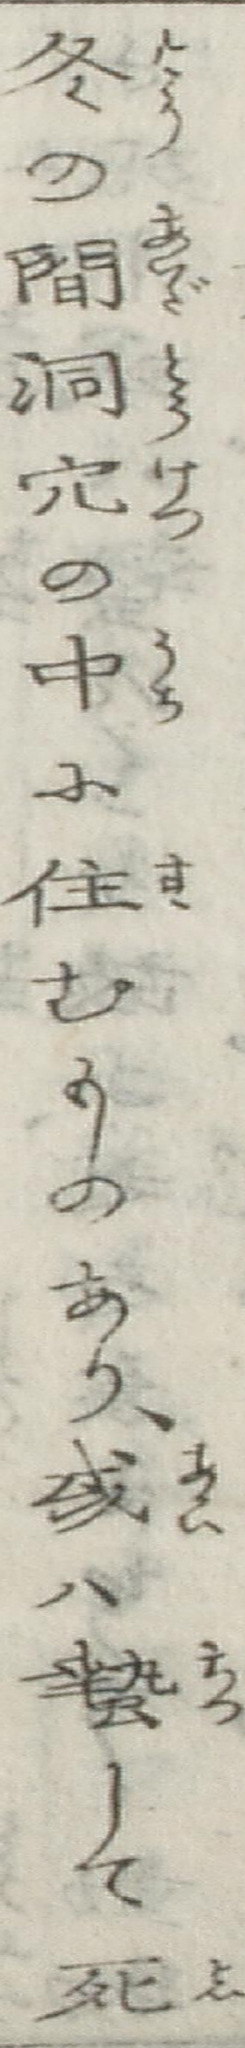冬の間洞穴の中に住むものあり、或は蟄して死
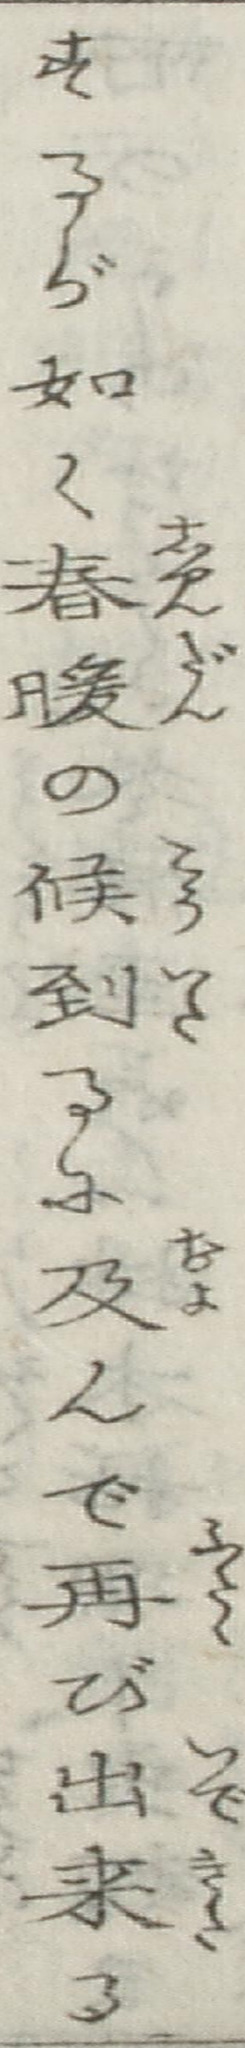するが如く春暖の候到るに及んで再び出来る
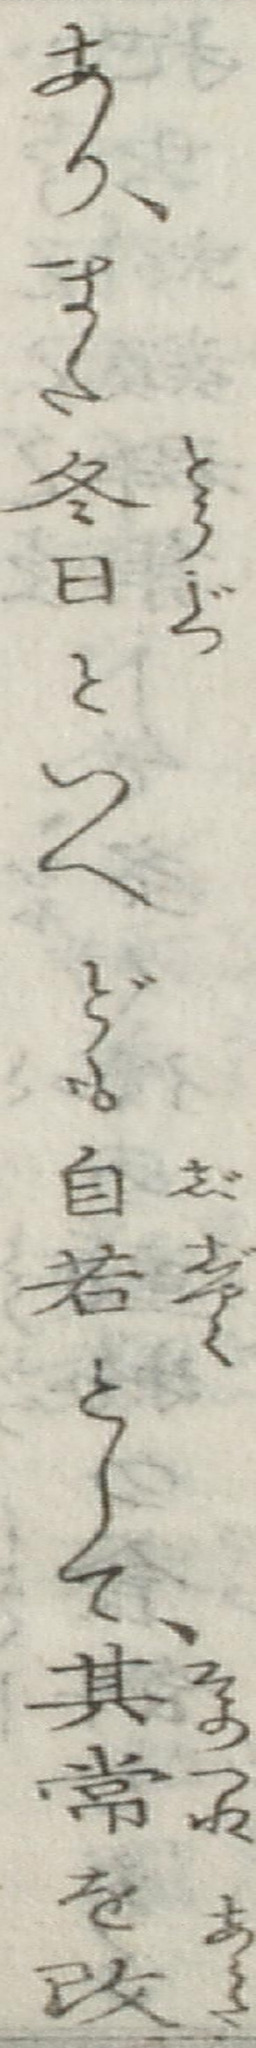あり、また冬日といへども自若として、其常を改
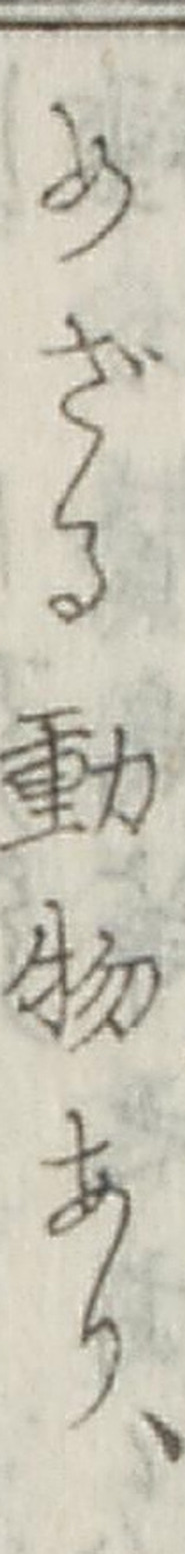めざる動物あり、
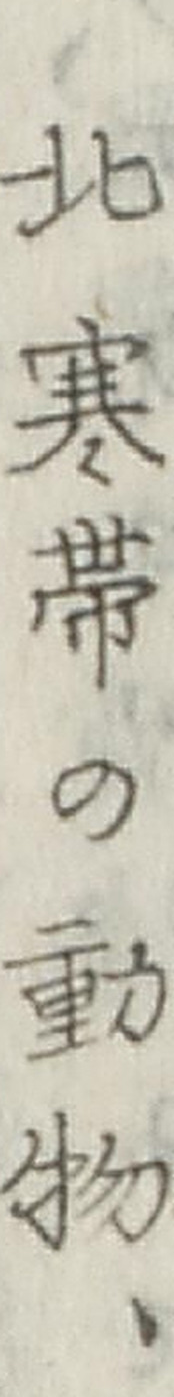北寒帯の動物、
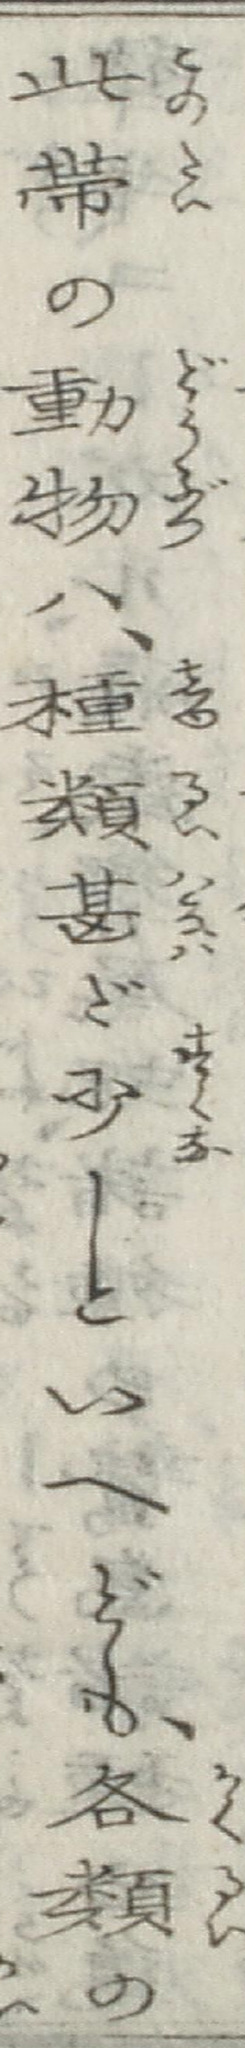此帯の動物は、種類甚だ少しといへども、各類の
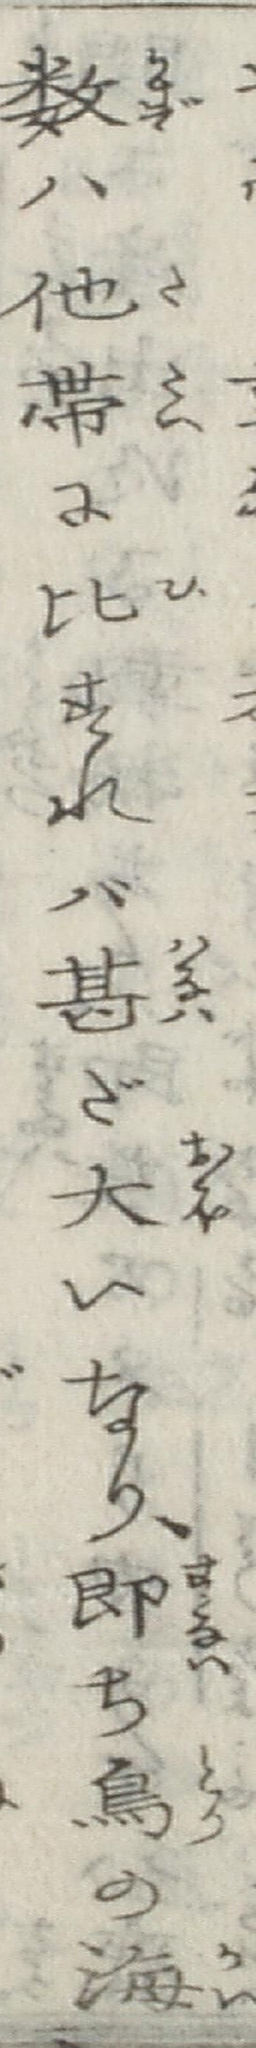数は他帯に比すれば甚だ大いなり、即ち鳥の海
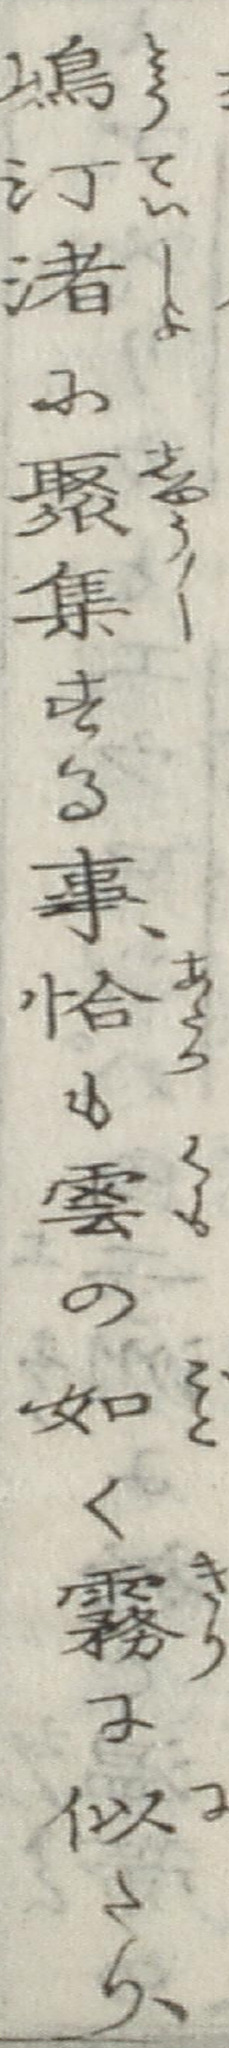嶋汀渚に聚集する事、恰も雲の如く霧に似たり、
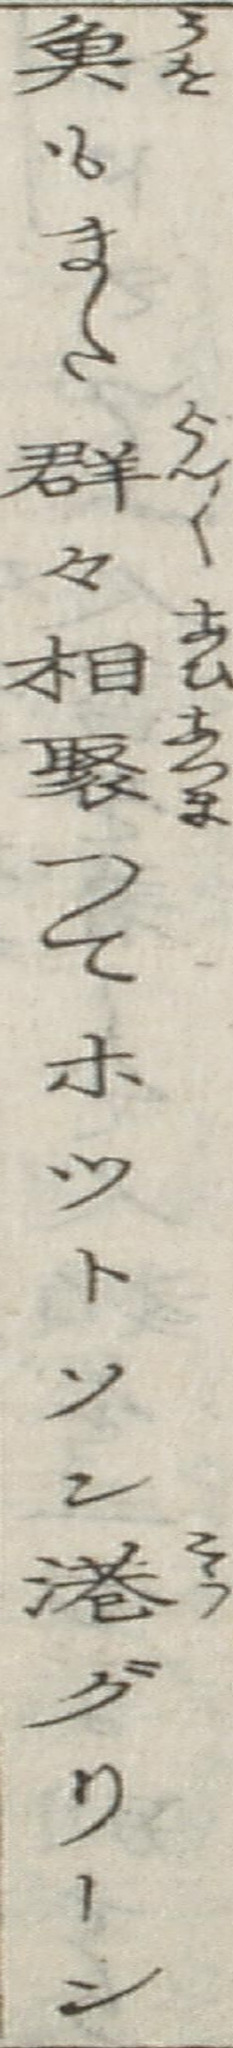魚もまた群ゝ相聚つてホツトソン港グリーン
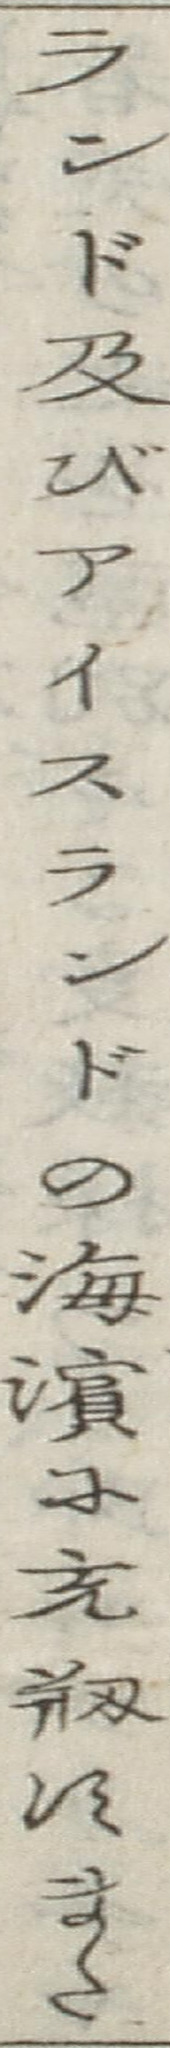ランド及びアイスランドの海濱に充靭すまた
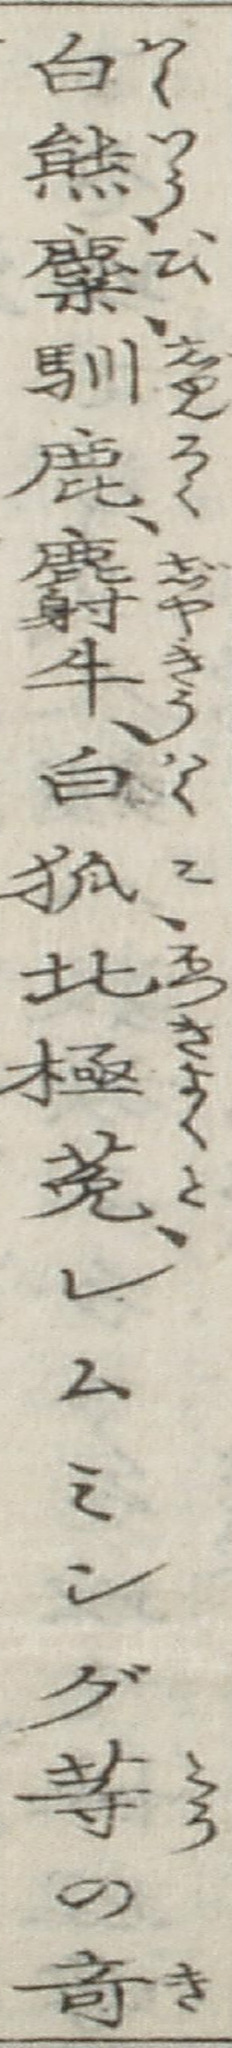白熊、麋、馴鹿、麝牛、白狐、北極兎、レムミング等の奇
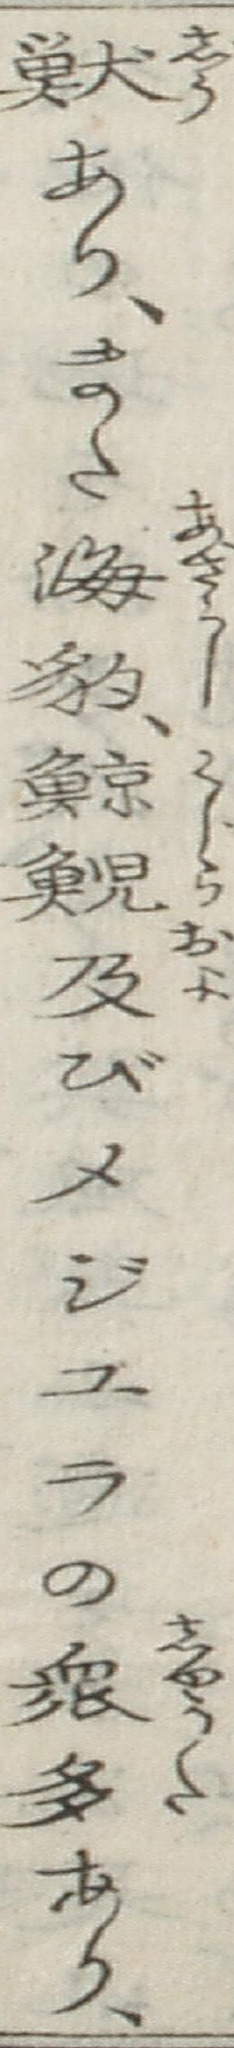獣あり、また海豹、鯨鯢及びメジユラの衆多あり、
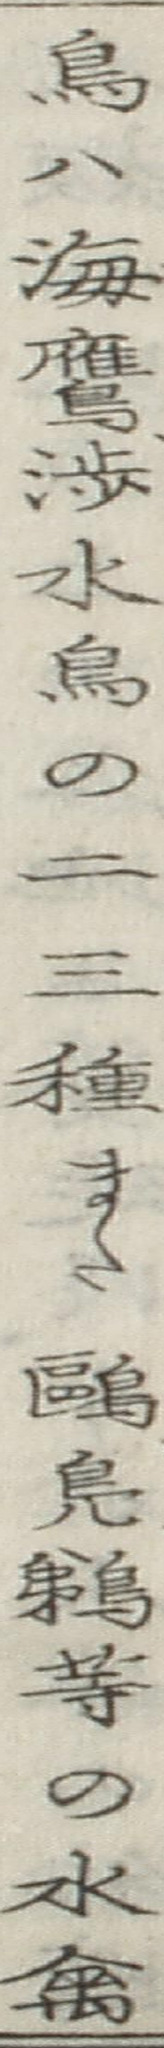鳥は海鷹、渉水鳥の二三種、また鴎、鳬、鵜等の水禽
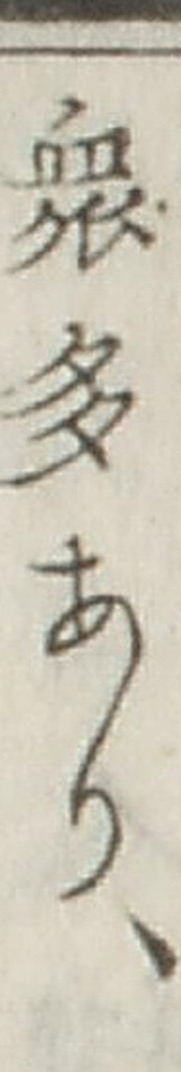衆多あり、
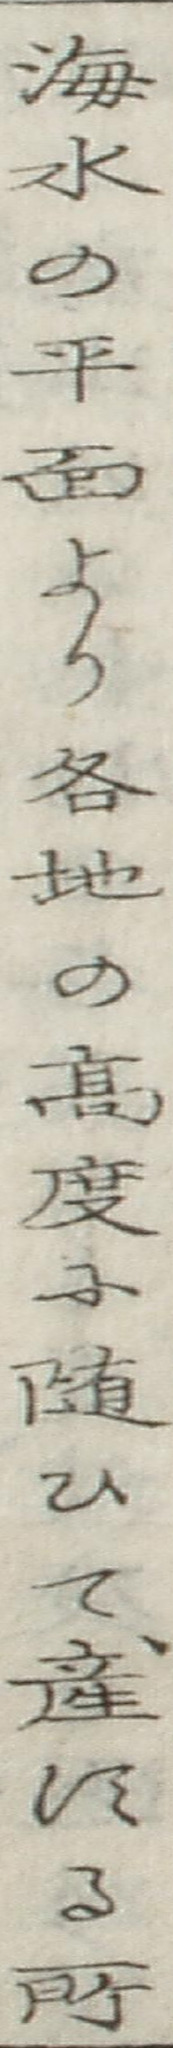海水の平面より各地の高度に随ひて、産する所
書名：訓蒙　天然地理學　下
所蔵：東京大学地震研究所図書室 Earthquake Research Institute Library, The University of Tokyo, JAPAN
